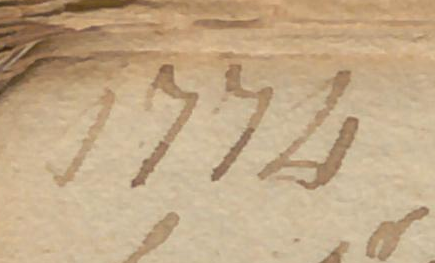1774
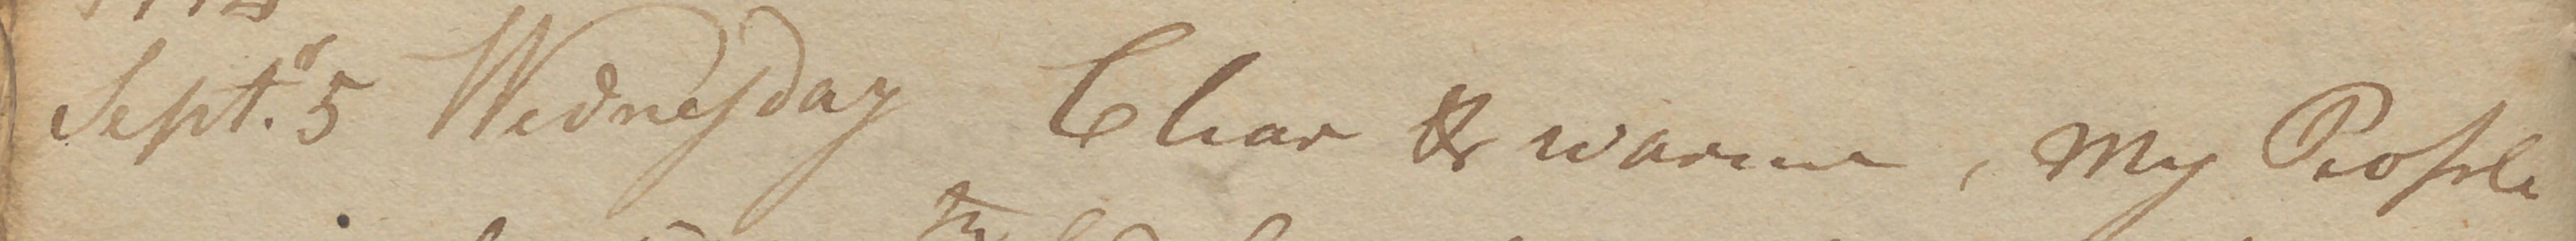Sept^r. 5 Wednesday Clear & warme, my People
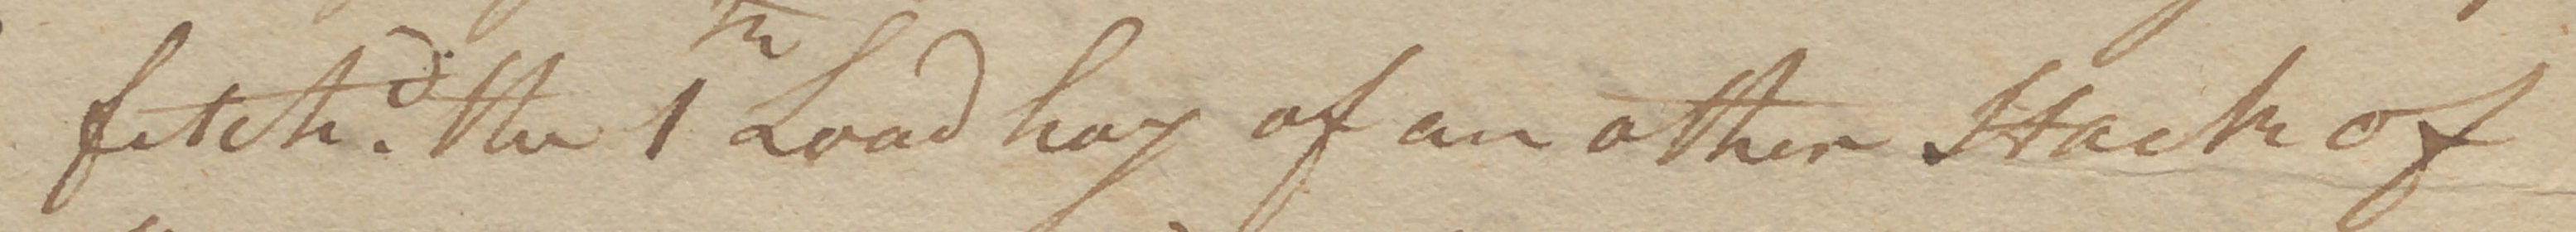fetch^d. the 1^th Load hay of an other Stack of
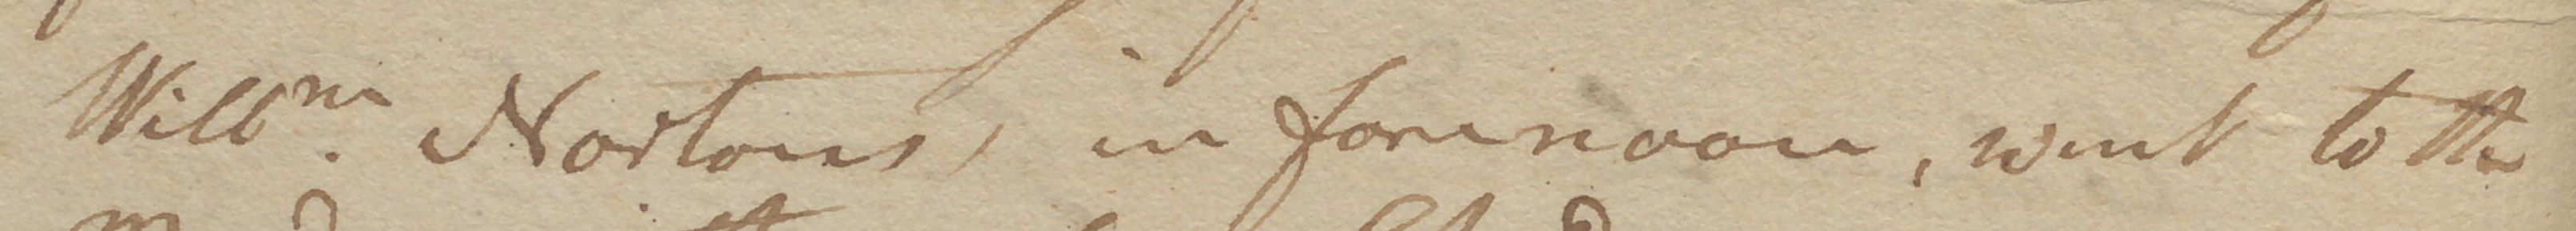Will^m. Nortons, in forenoon, went to the
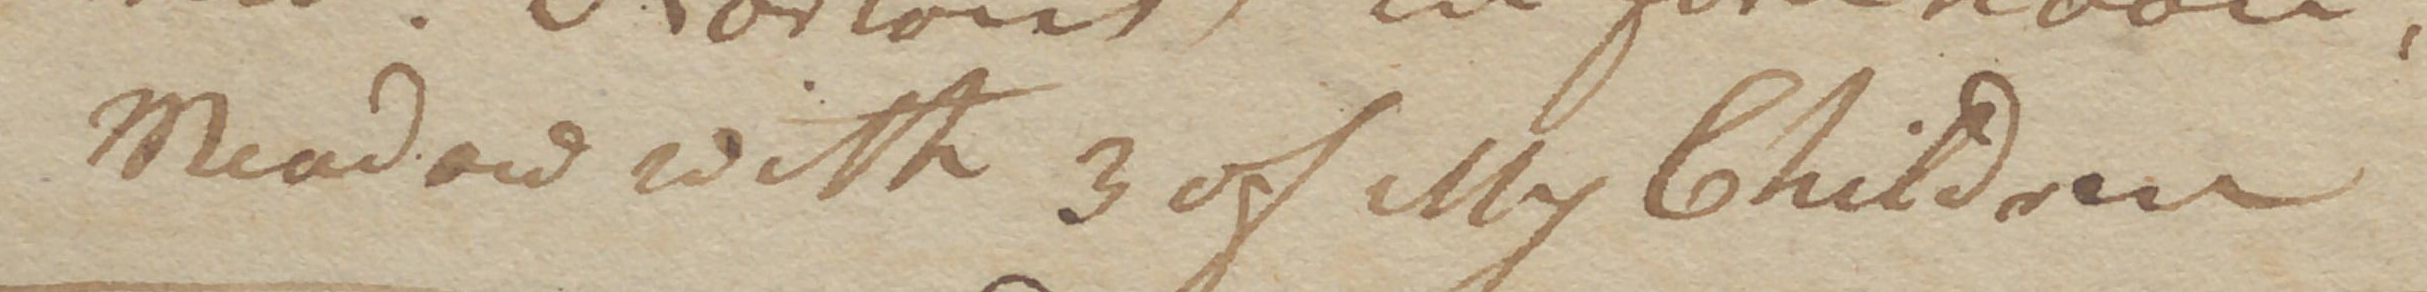Meadow with 3 of My Children
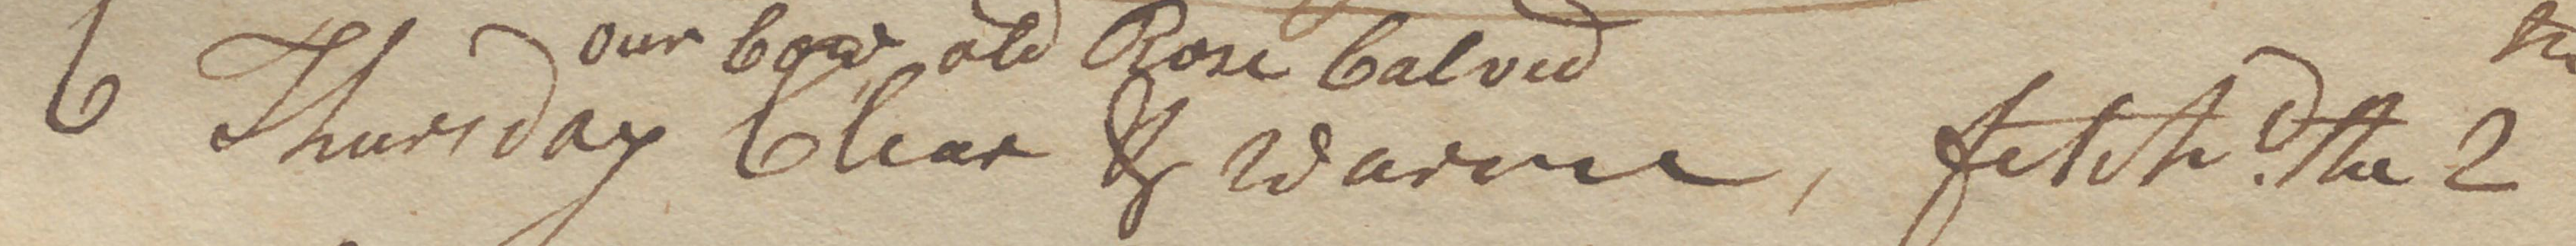6 Thursday Clear & warme, fetch^d. the 2^th
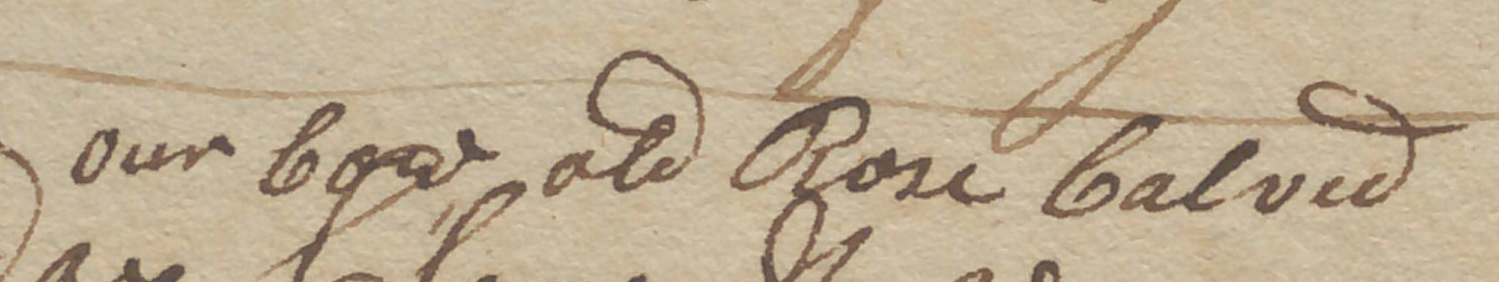our Cow, old Rose Calved
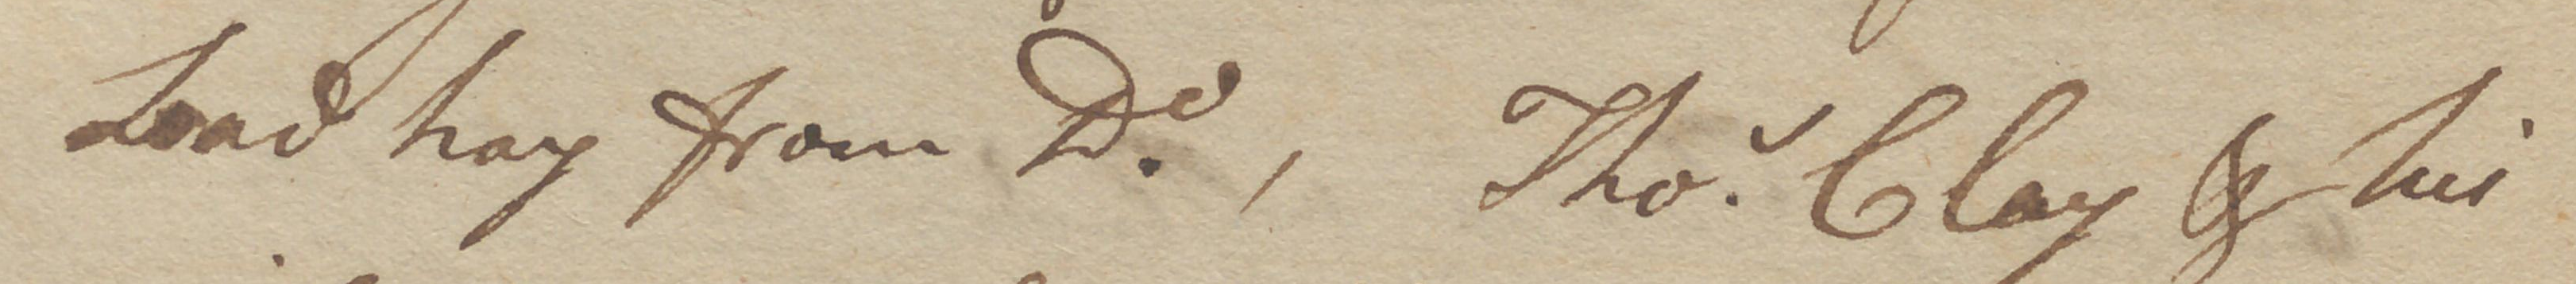Load hay from D^o., Tho^s. Clay & his
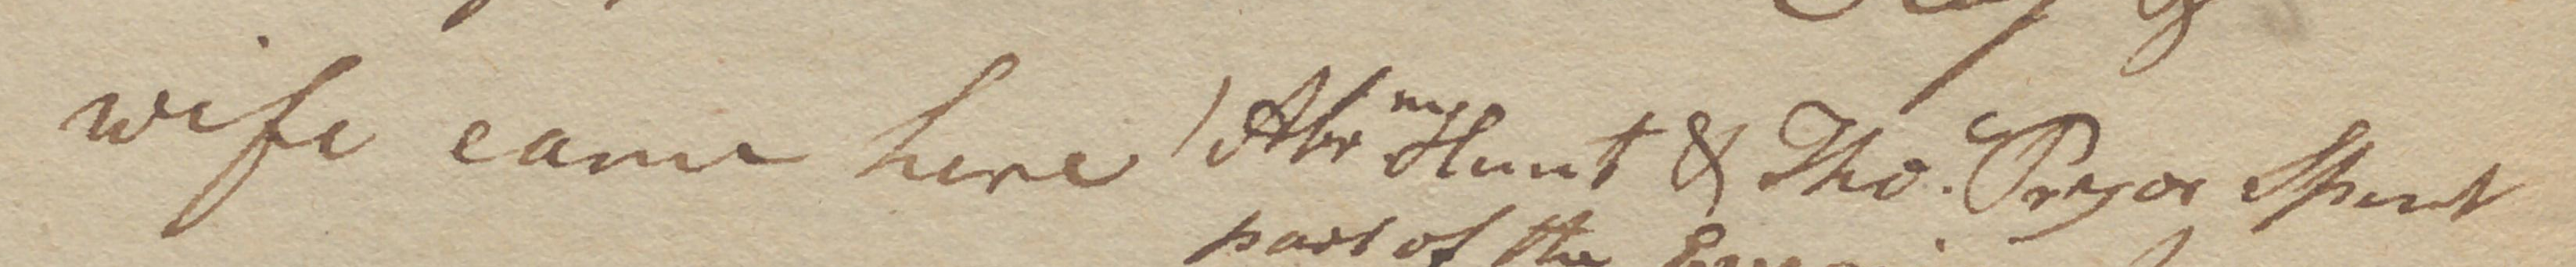wife came here, Abr. Hunt & Tho^s. Pryor spent
